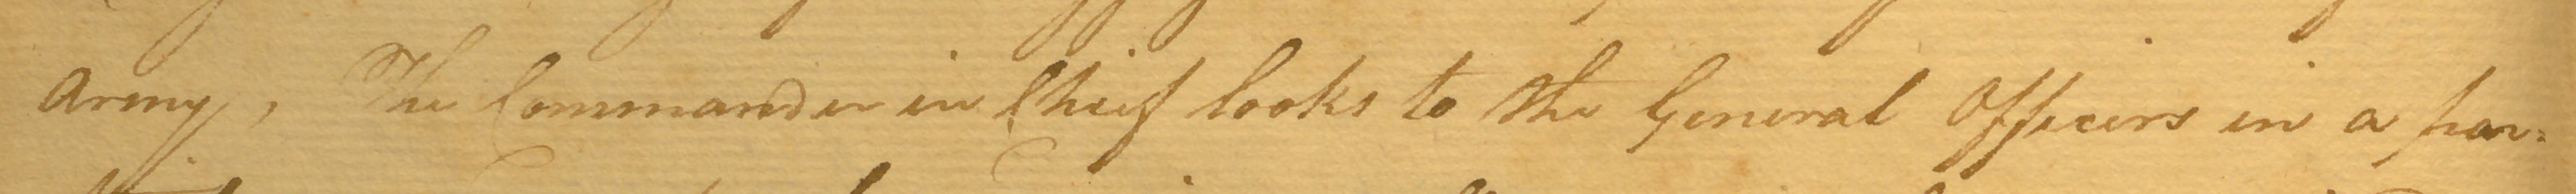Army, The Commander in Chief looks to the General Officers in a par
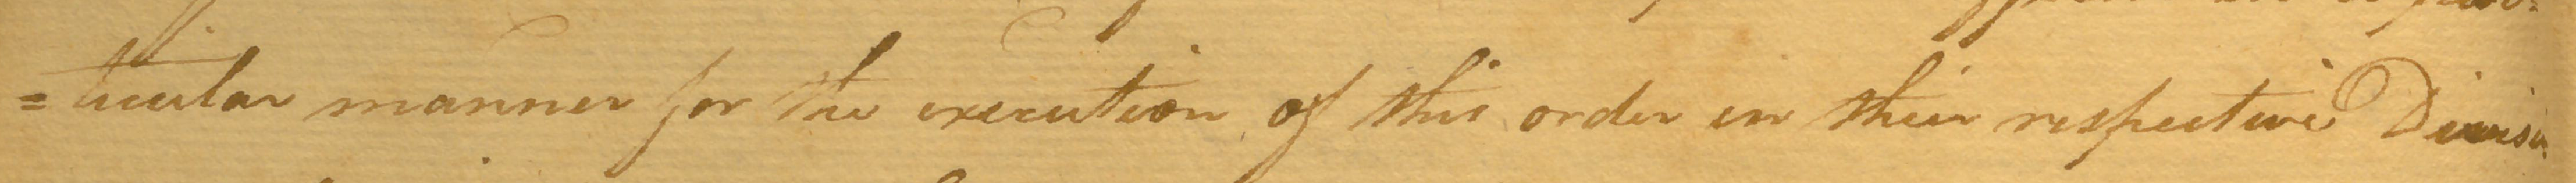-ticular manner for the execution of this order in their respective Divisi-
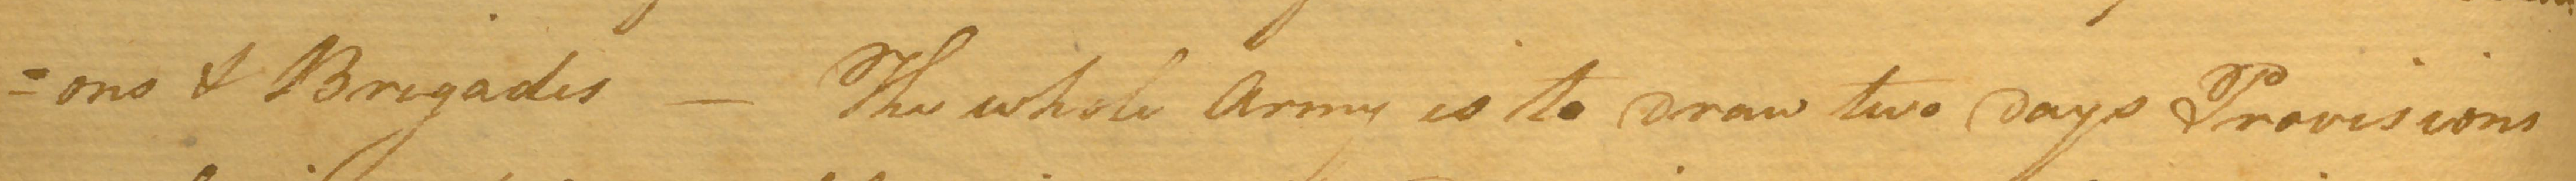-ons & Brigades- The whole Army is to draw two days Provisions
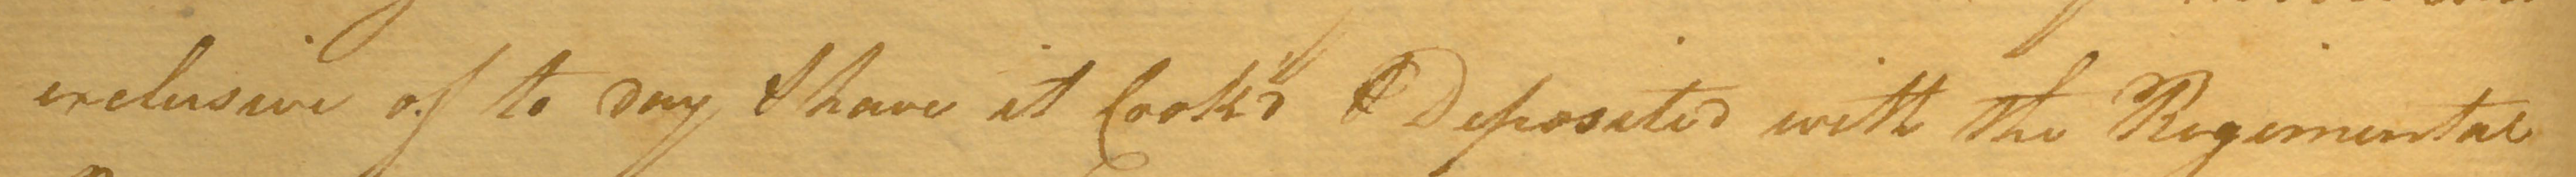exclusive of to day & have it Cookd & Deposited with the Regimental
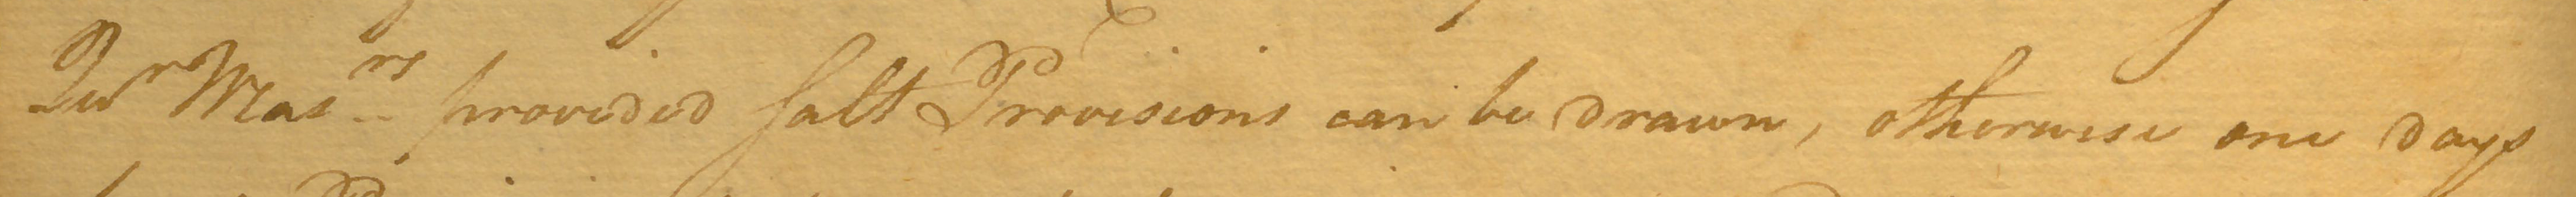Qu^r Mas^rs. provided salt Provisions can be drawn, otherwise on days
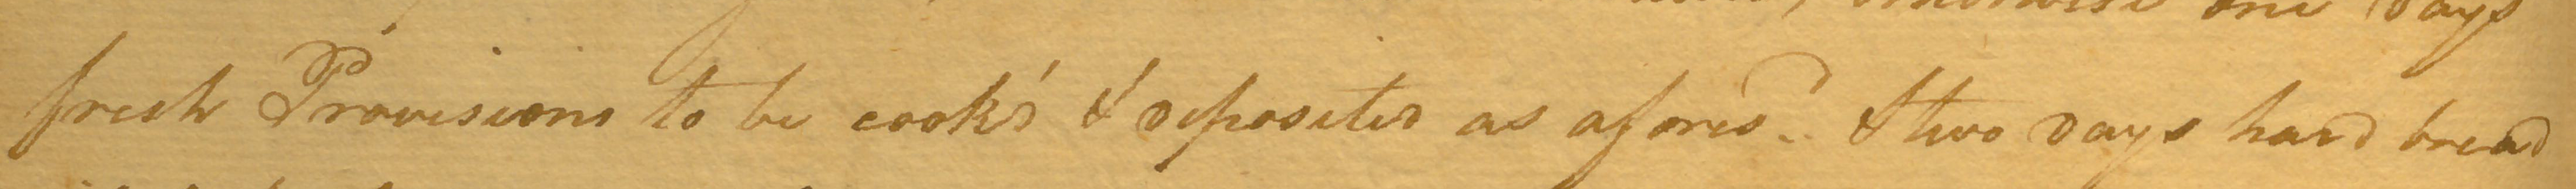fresh Provisions to be cook'd & deposited as afores^d. & two days hard bread
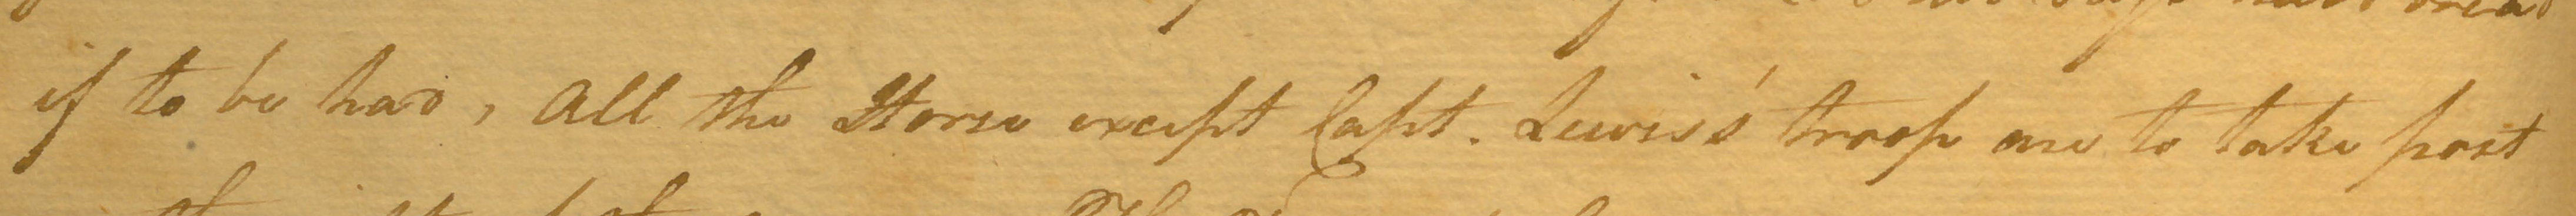if to be had, All the Horse except Capt. Lewis's troop are to take part
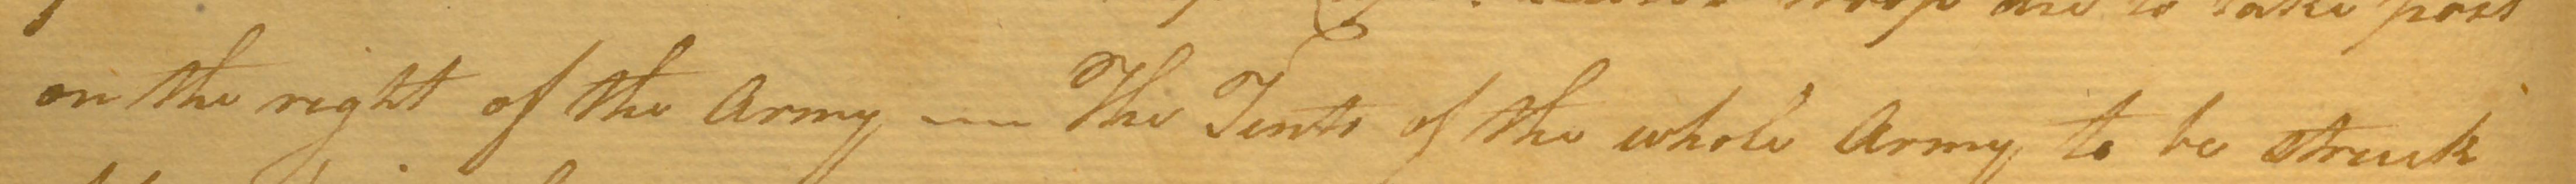on the right of the Army- The Tents of the whole Army to be struck
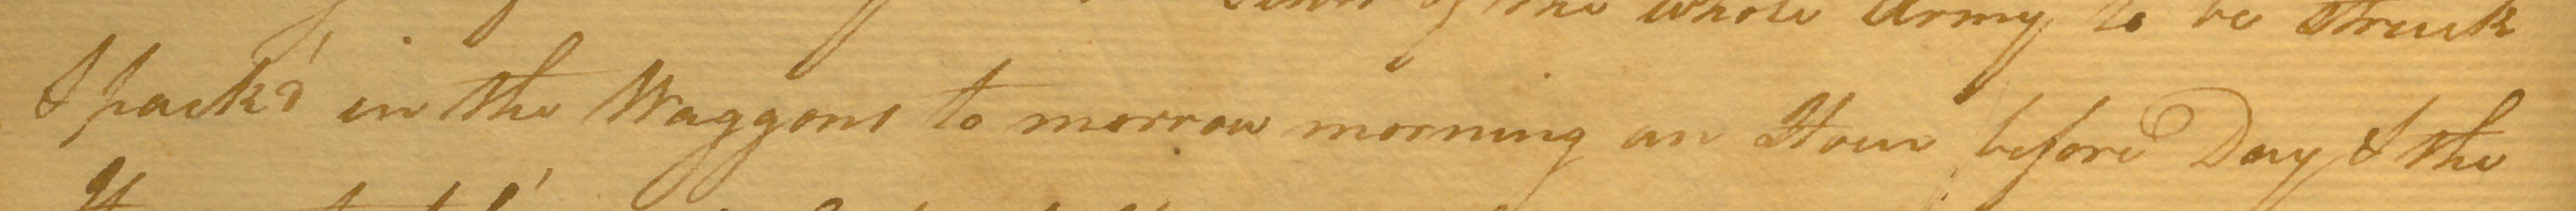& pack'd in the Waggons to morrow morning an Hour before Day & the
